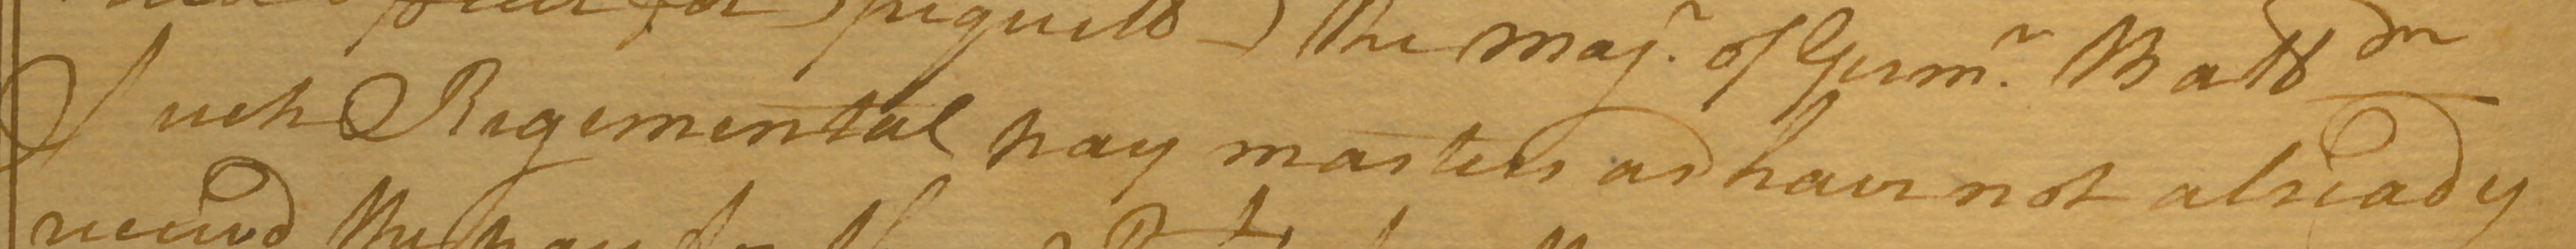Such Regimental pay masters as have not already
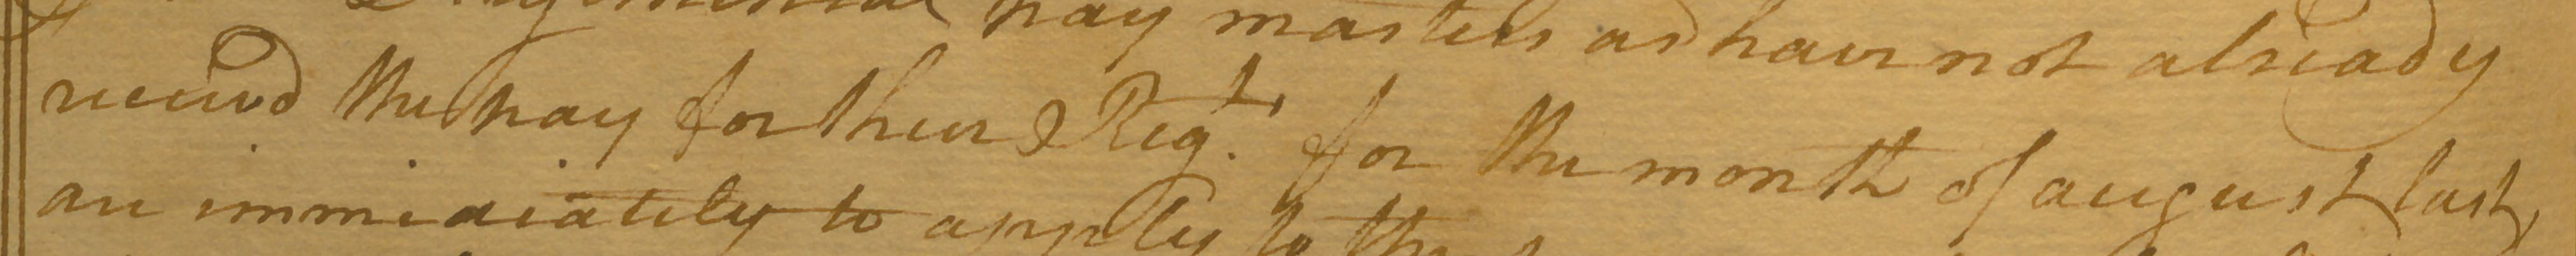receivd the pay for their Reg^t. for the month of august last
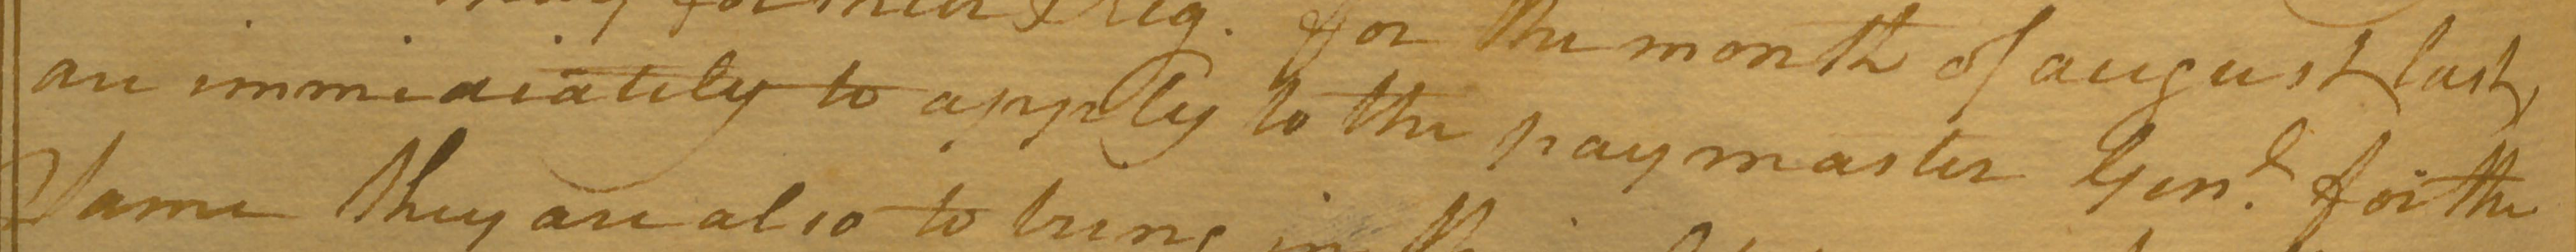are immediately to apply to the paymaster Gen^l. for the
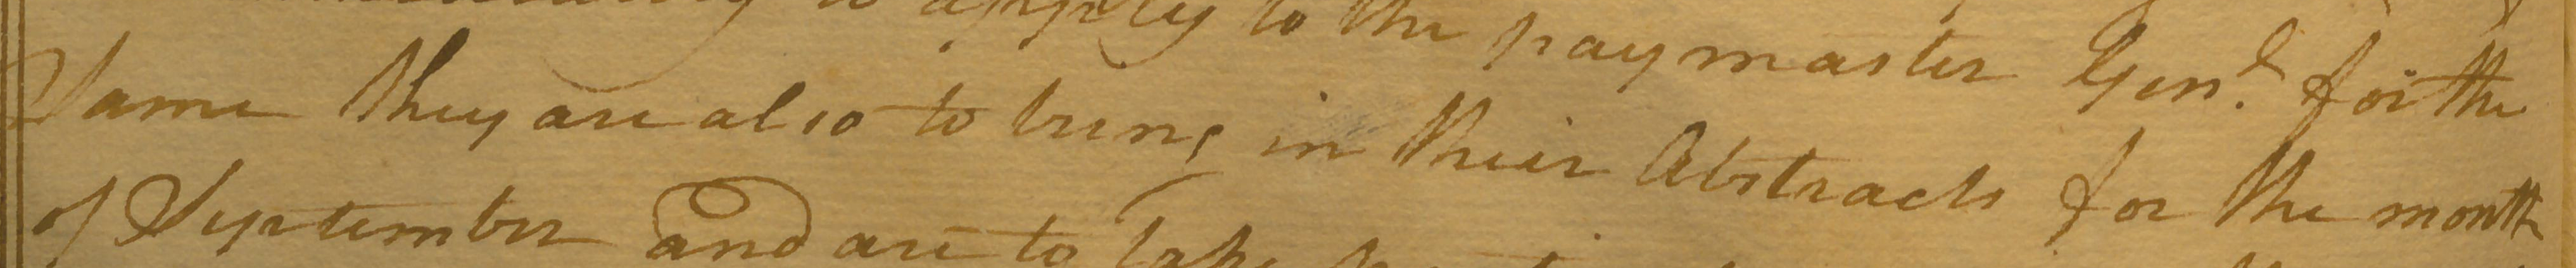Same they are also to bring in their abstracts for the month
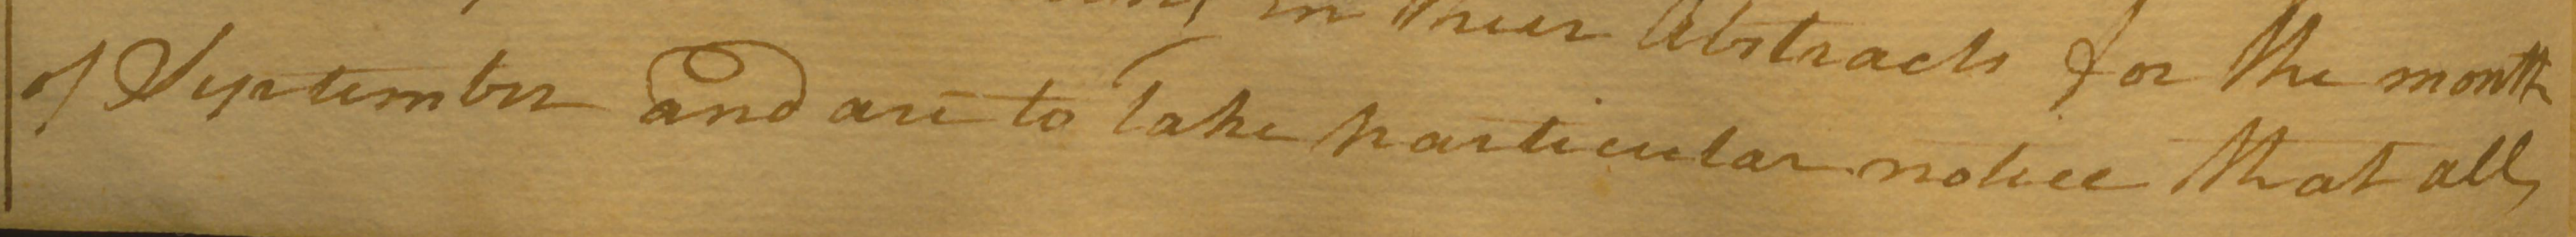of September and are to take particular notice that all
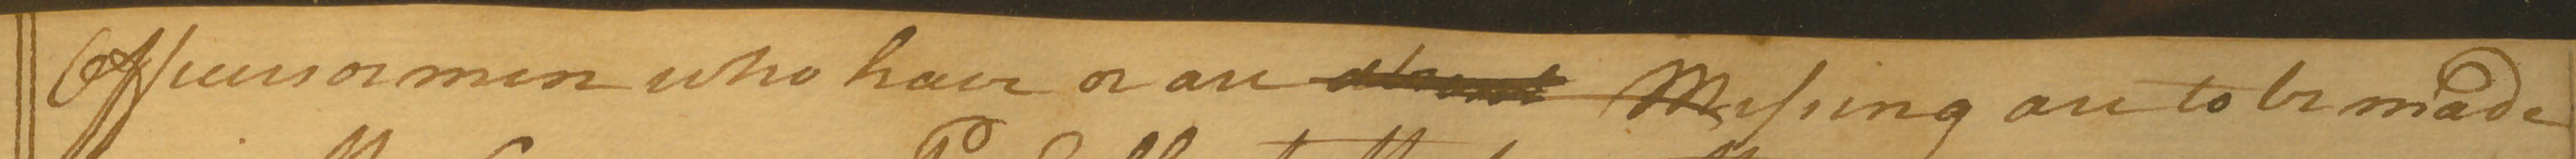Officers or men who have or are [absent] Missing are to be made
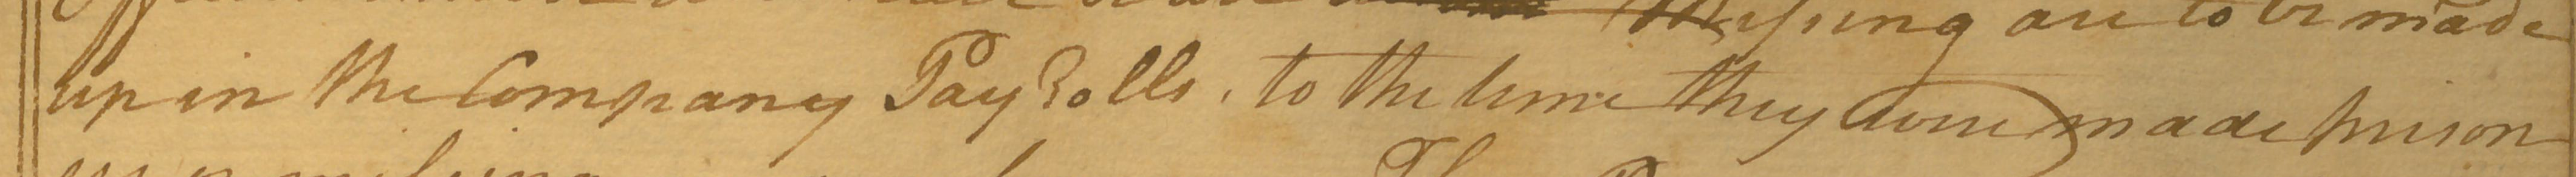up in the Company Pay rolls to the time they were made prison
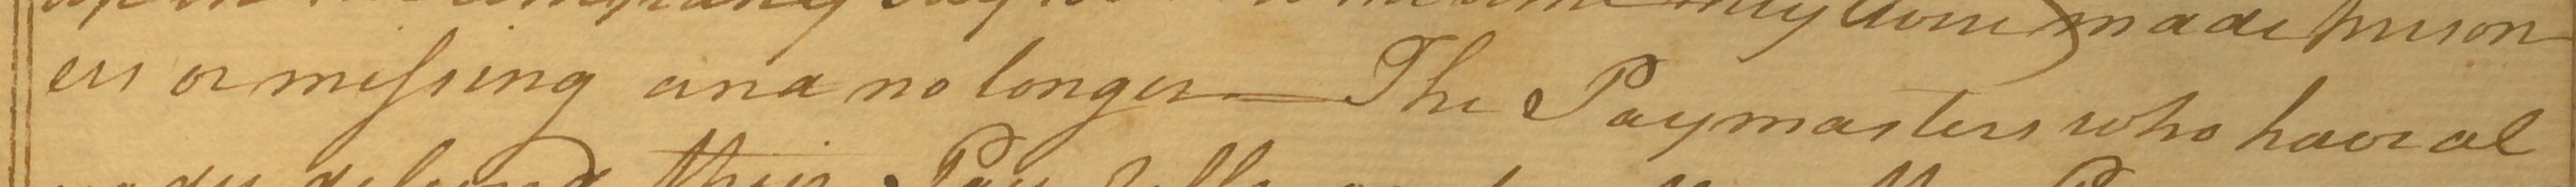ers or missing and no longer- The Paymasters who have al
